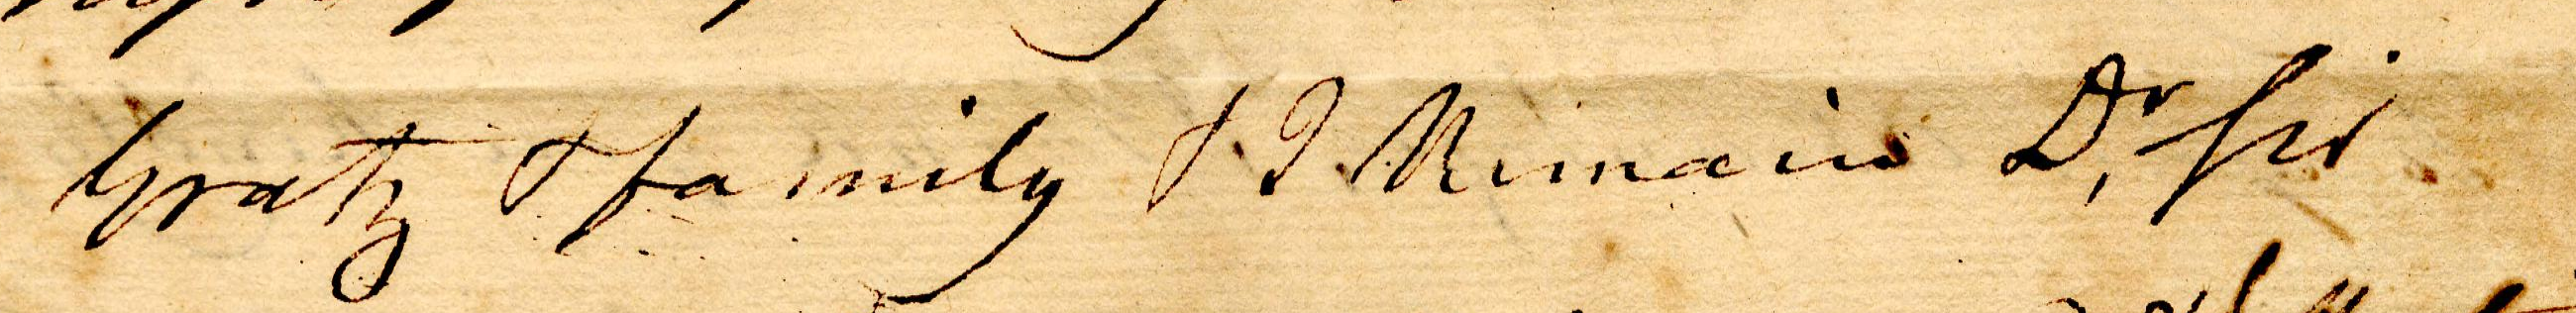Gratz, & family & I Remain D^r. Sir
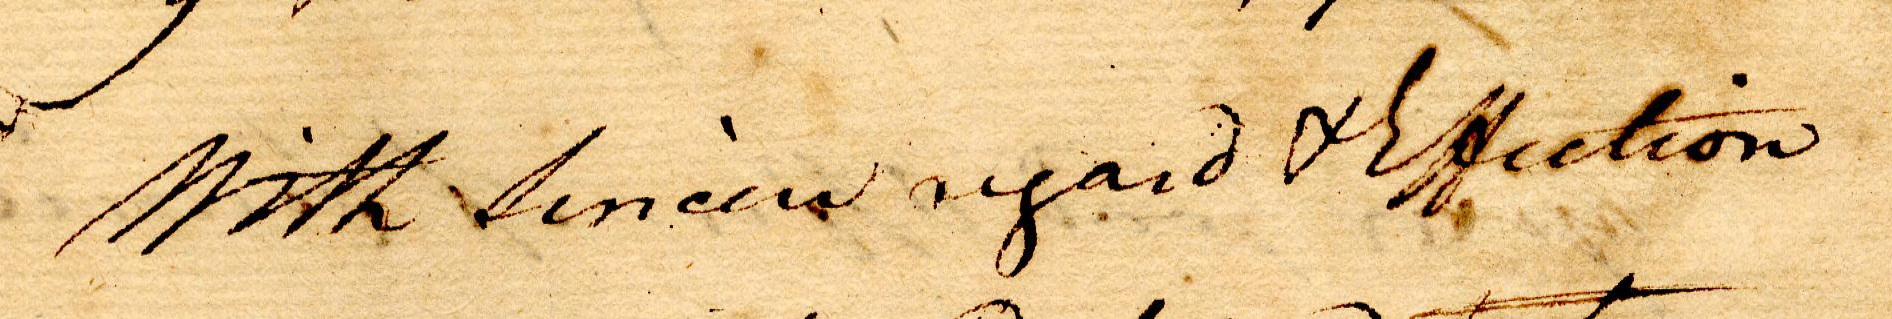With Sincere regard & Effection
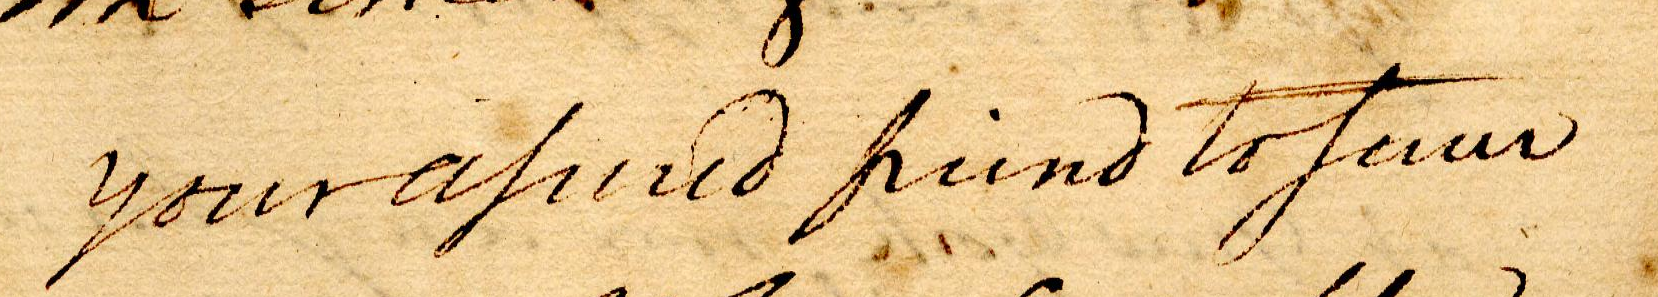your asured friend to serve
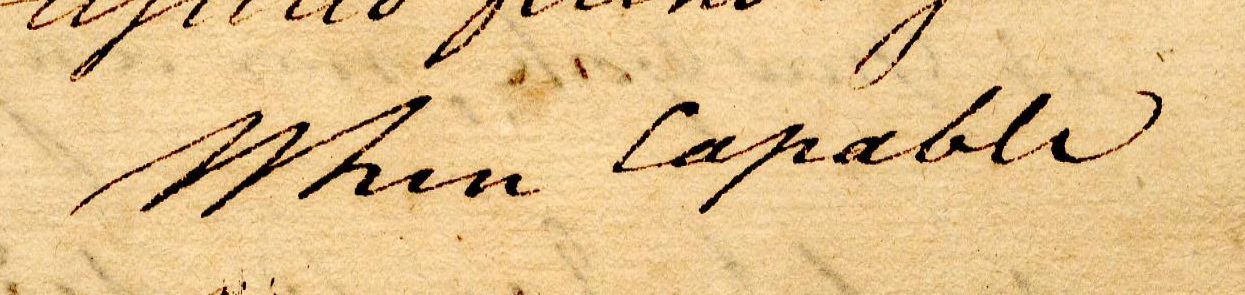When Capable
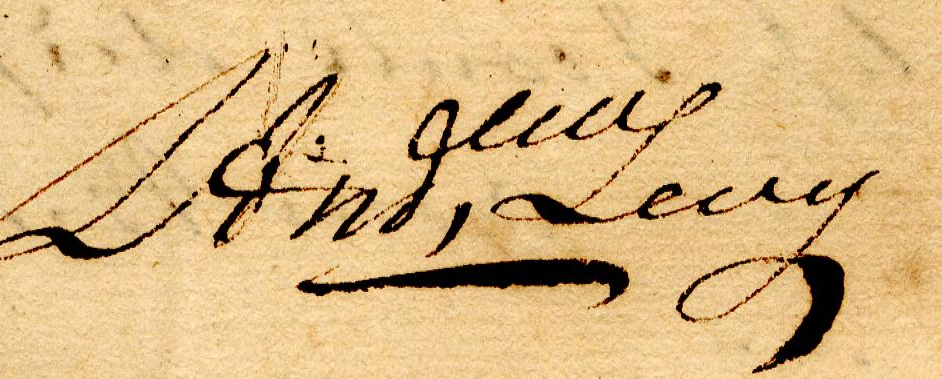And^rew Levy
